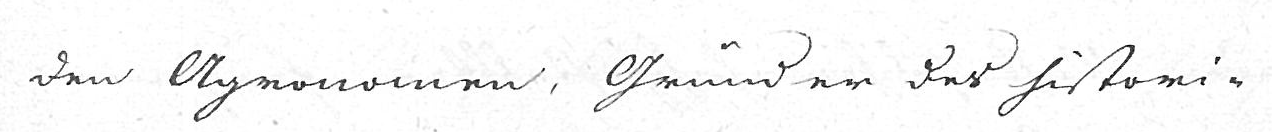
den Agronomen, Gründer des histori-
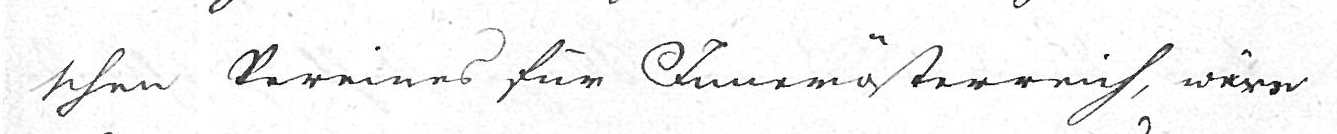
schen Vereines für Innerösterreich, wäre
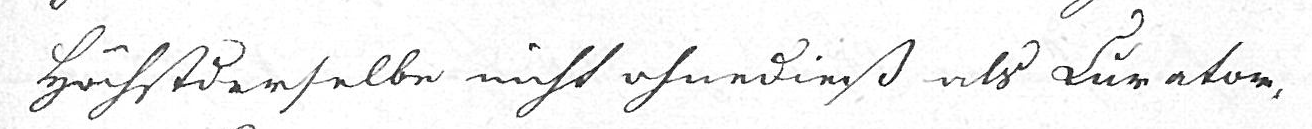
Höchstderselbe nicht ohnedieß als Curator,
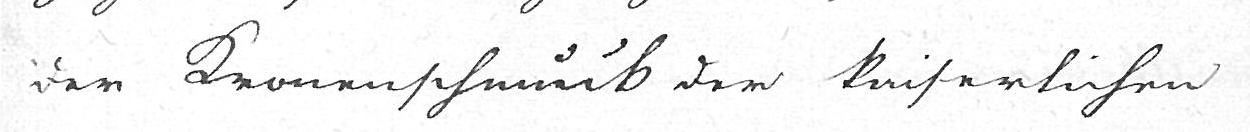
der Kronenschmuck der kaiserlichen
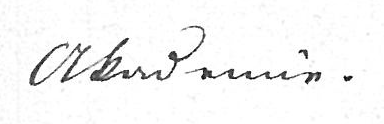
Akademie.
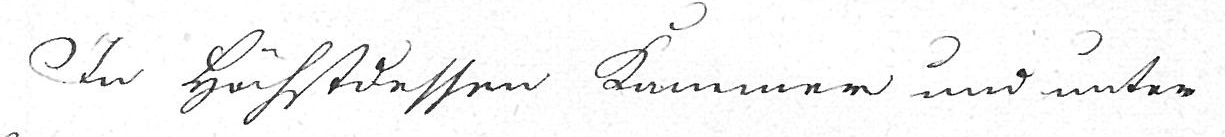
In Höchstgessen Kamemr und unter
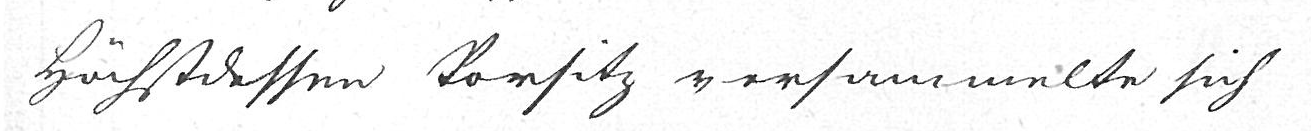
Höchstdessen Vorsitz versammelte sich
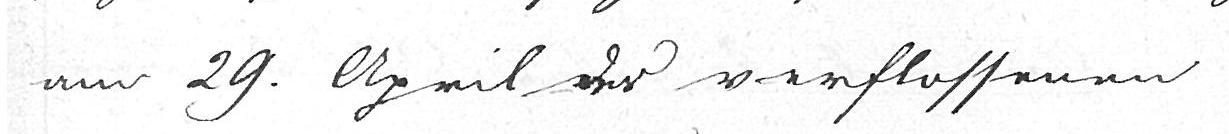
am 29. April des verflossenen
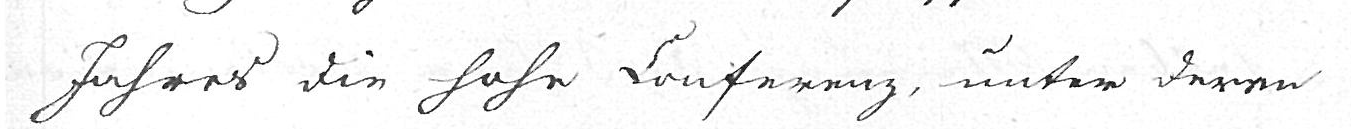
Jahres die hohe Conferenz, unter deren
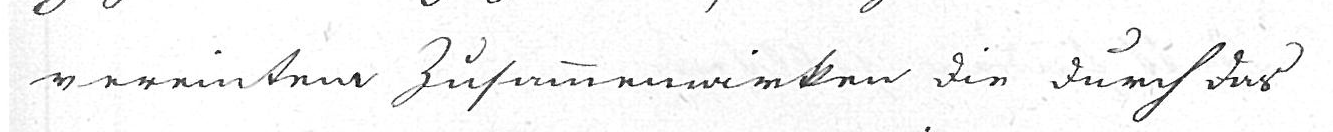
vereintem Zusammenwirken die durch das
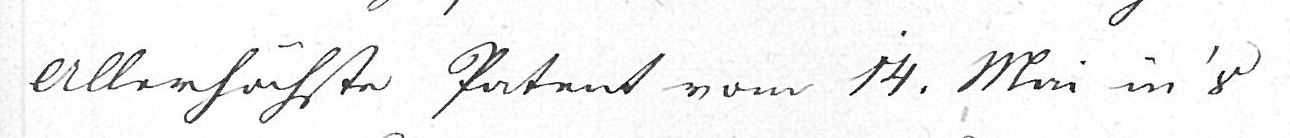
Allerhöchste Patent vom 14. Mai in's
